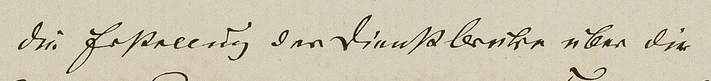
die Erstellung der Dienstbrüke über die
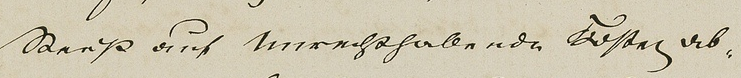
Reuß auf Unrechthabende Kosten ab-
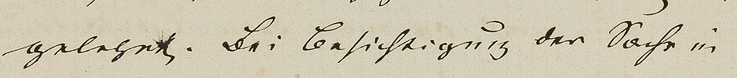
gelehnt. Bei Besichtigung der Sache in
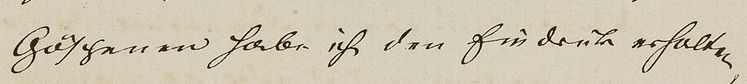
Göschenen habe ich den Eindruk erhalten,
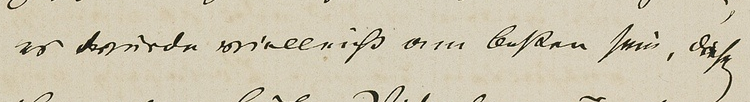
es würde vielleicht am besten sein, diesen
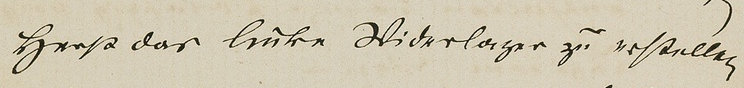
Herst das linke Widerlager zu erstellen
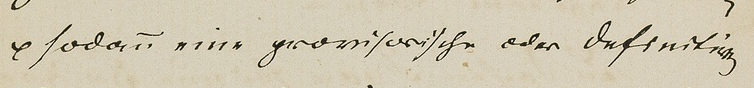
& sodann eine provisorische oder definitive
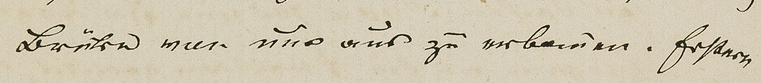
Brüke von uns aus zu erbauen. Erstere
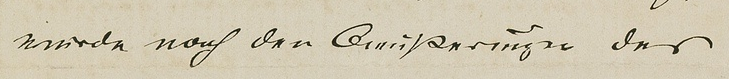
würde nach den Aeußerungen des
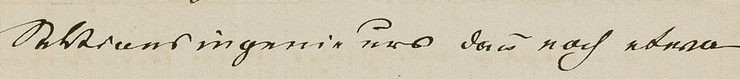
Sektionsingenieurs dann noch etwa
